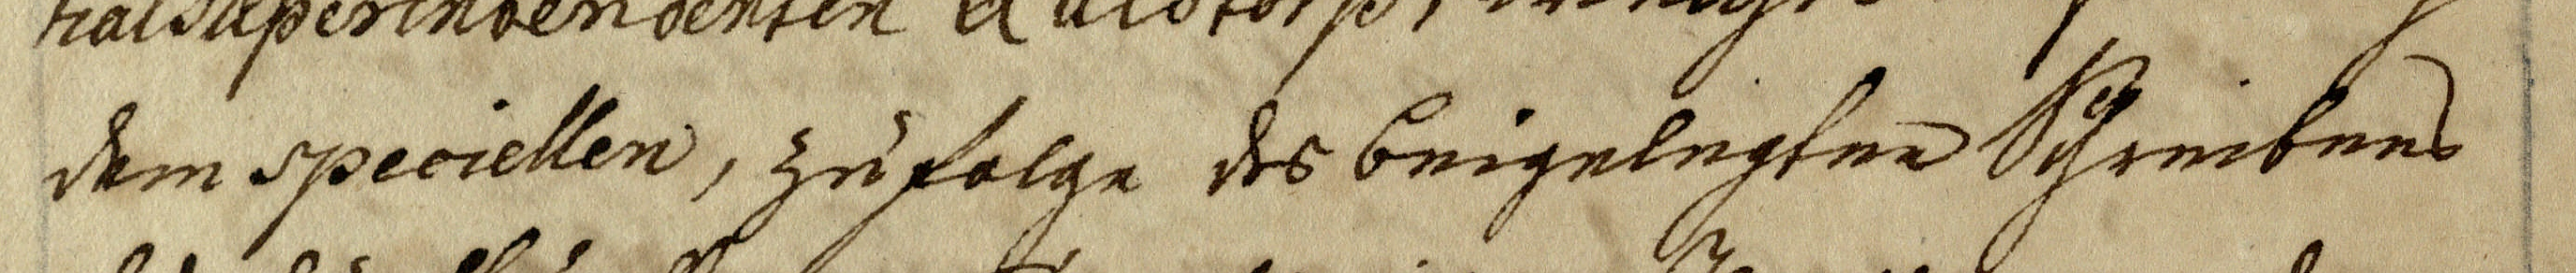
dem speciellen, zufolge des beigelegten Schreibens
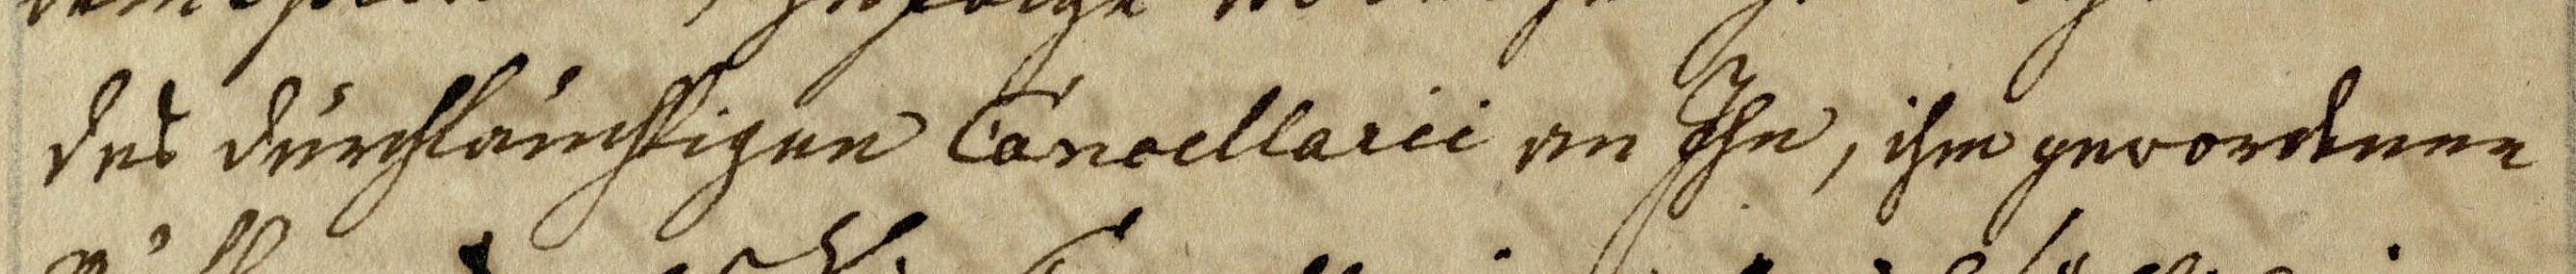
des durchlauchtigen Cancellarii an Ihn, ihm gewordenen
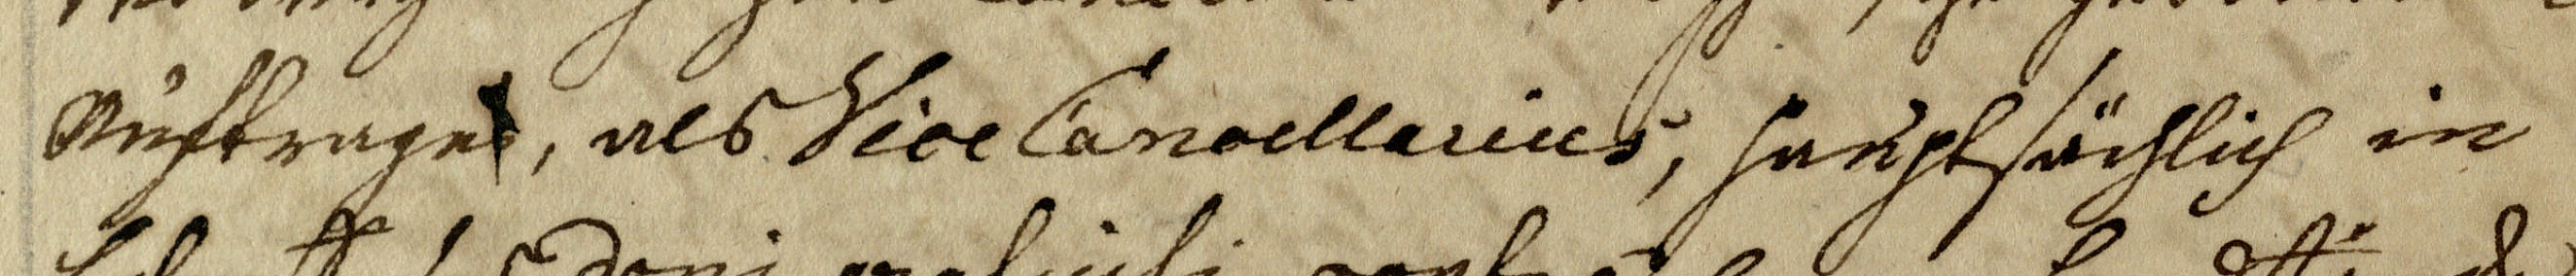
Auftrage, als Vice Cancellarius, hauptsächlich in
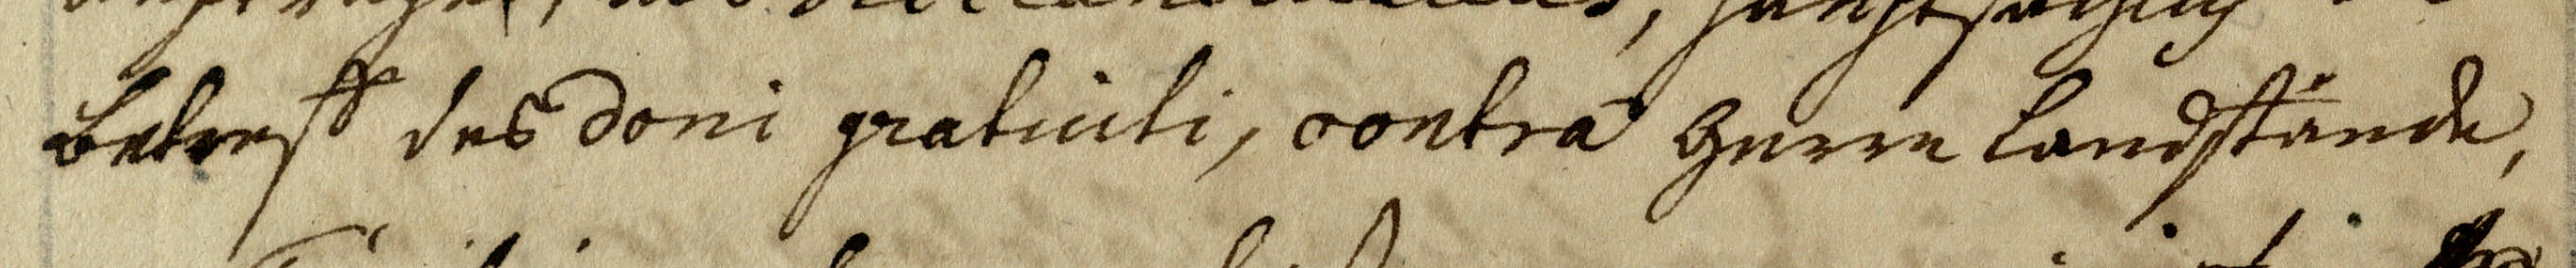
betref des doni gratuiti, contra Herrn Landstände
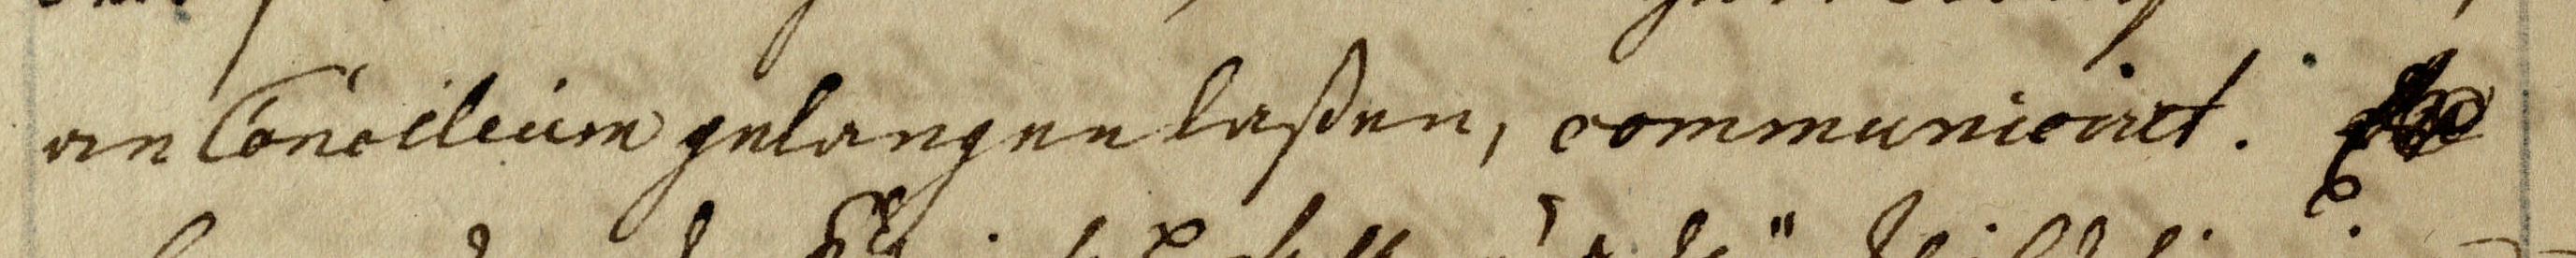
an Concilium gelangenlaßen, communiciret. an
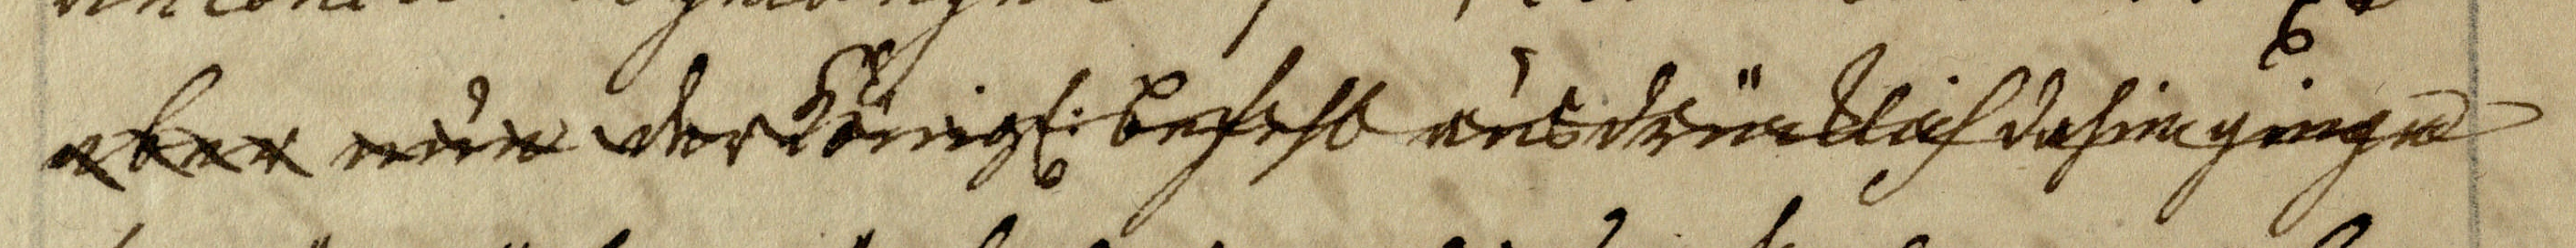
aber nun der Königl. Befehl ausdrücklich dahin ginge
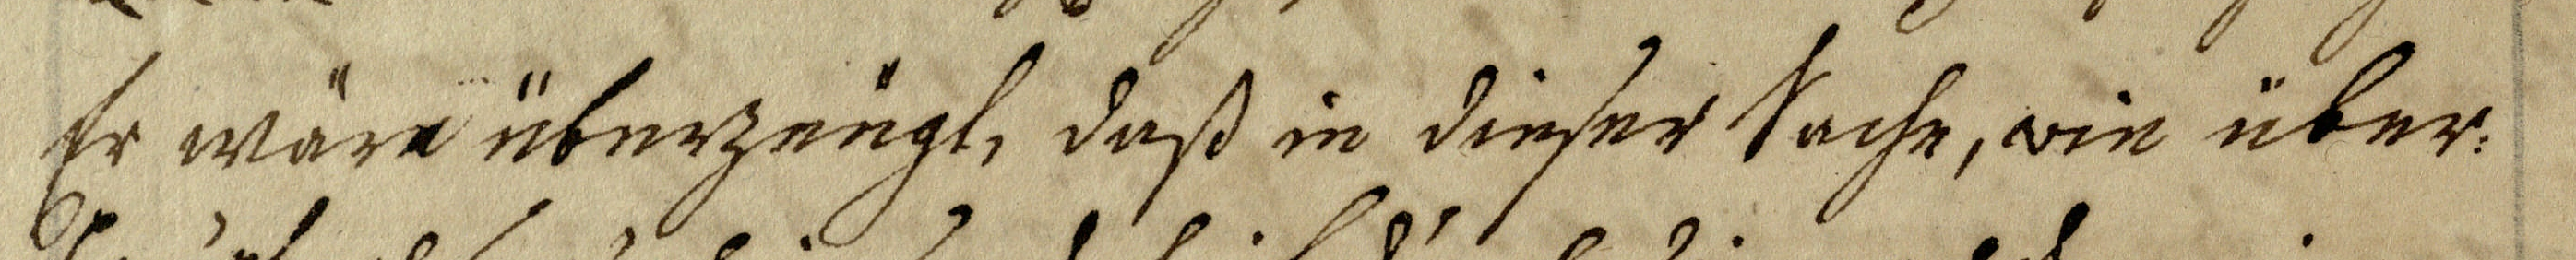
Er wäre überzeugt, daß in dieser Sache, wie über¬
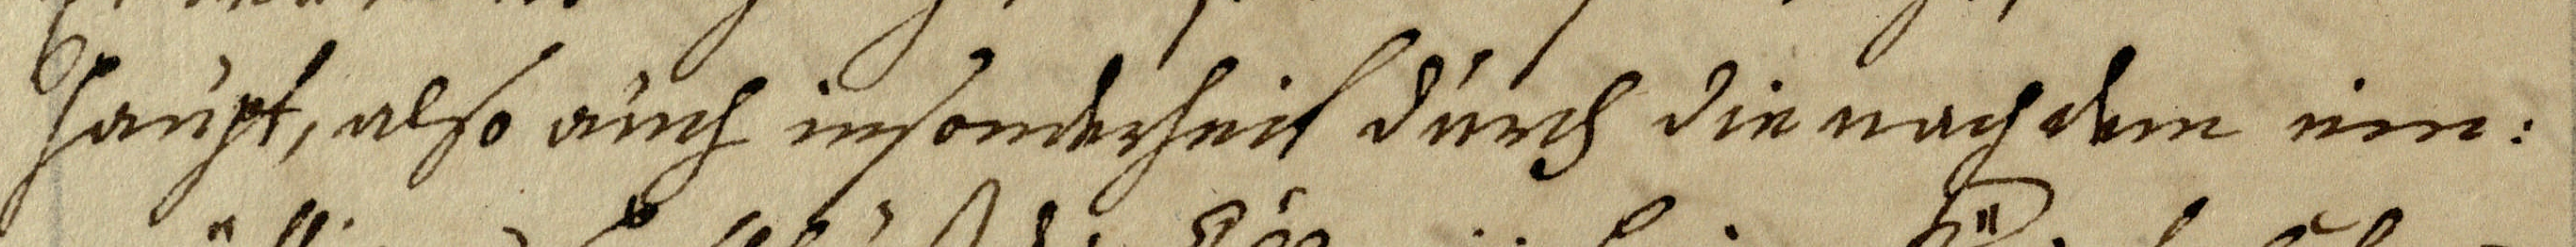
haupt, also auch insonderheit durch die nach dem ein¬
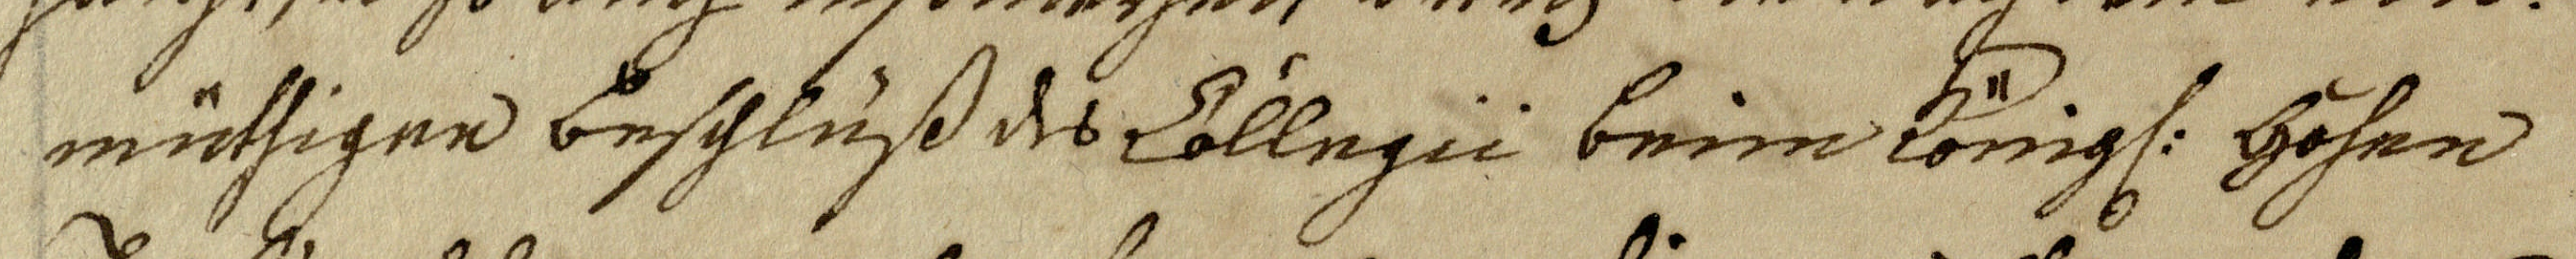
müthigen Beschluß des Collegii beim Königl. Hohen
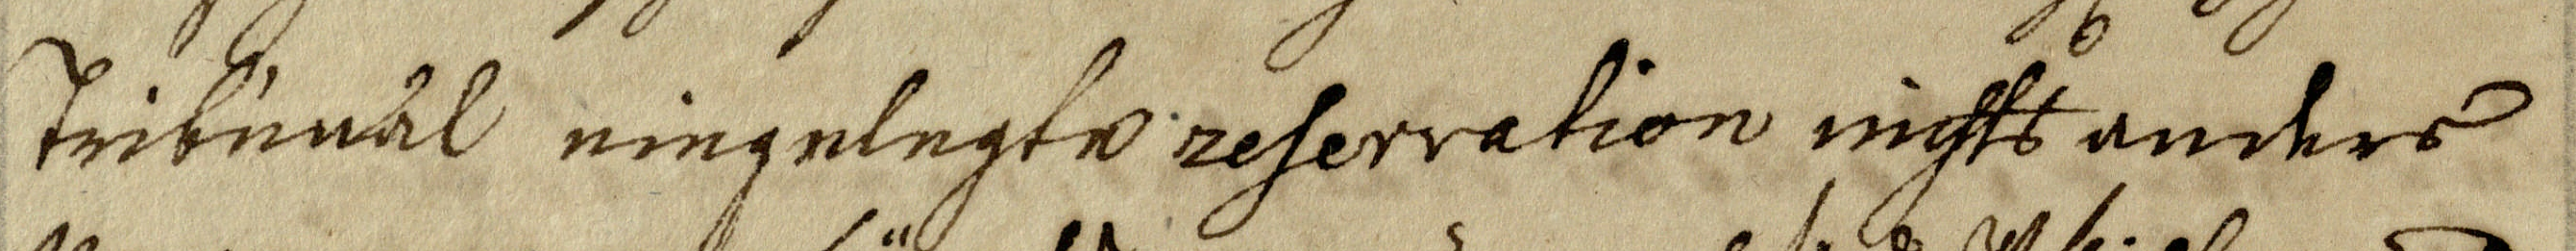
Tribunal eingelegte reservation nichts anders
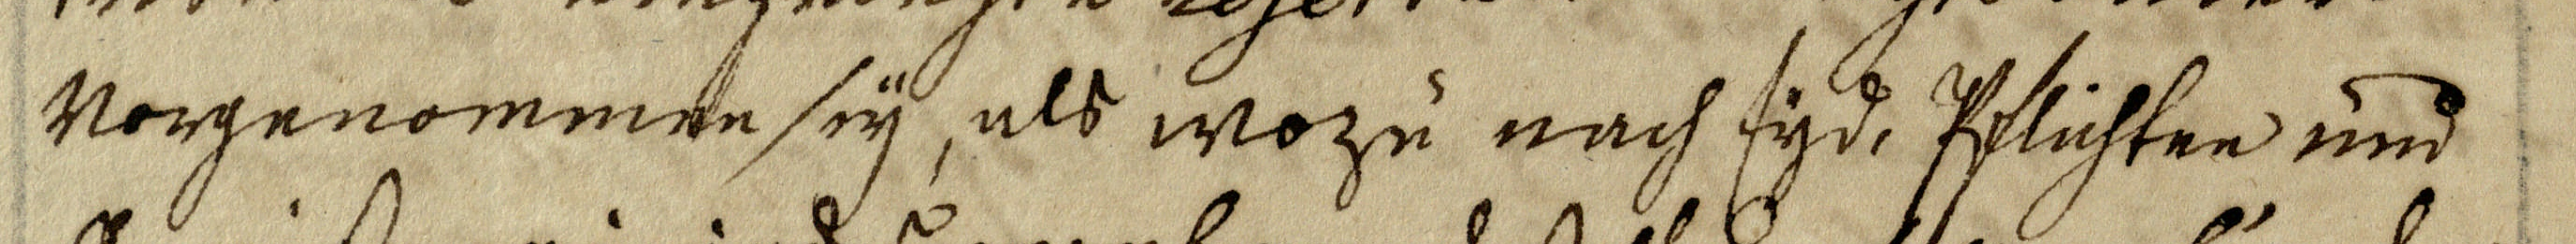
vorgenommen seÿ, als wozu nach Eÿd, Pflichten und
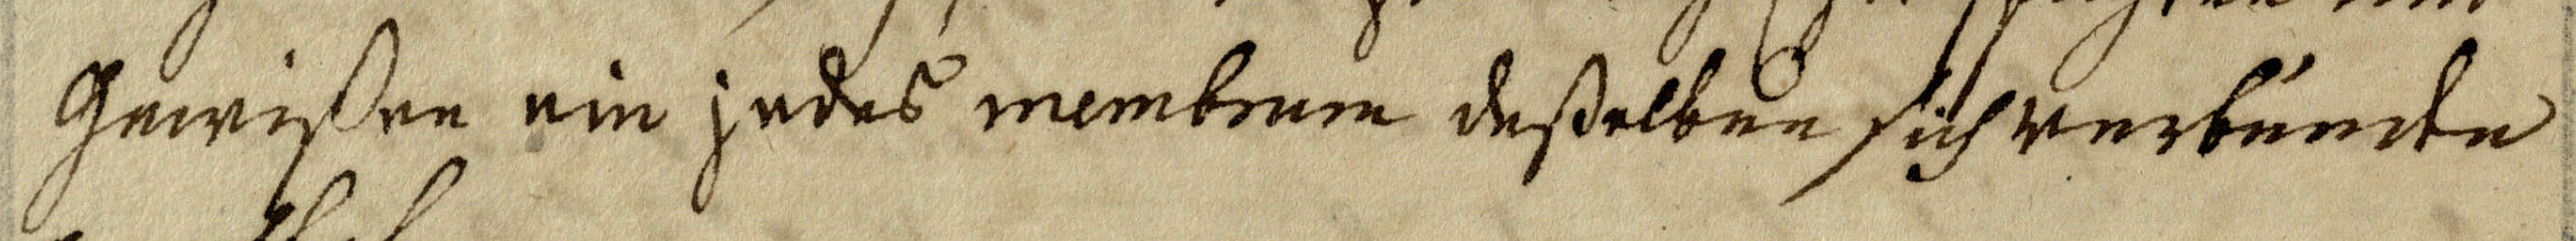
Gewißen ein jedes membrum deßelben sich verbunden
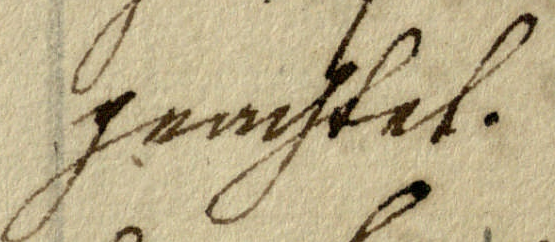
geachtet.
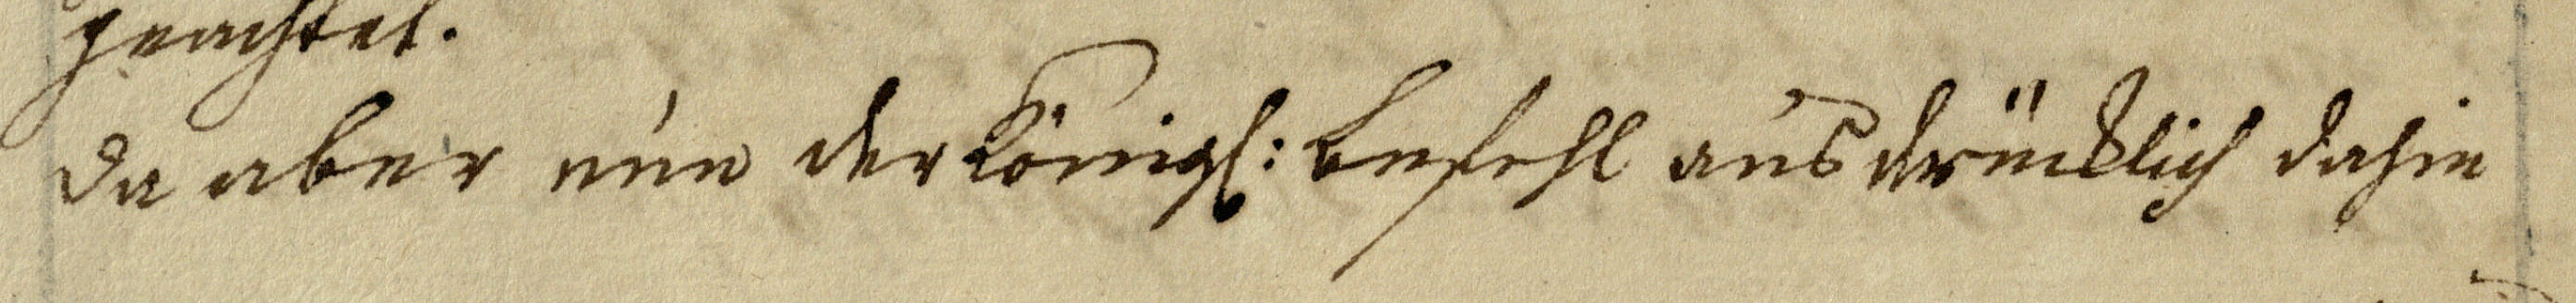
Da aber nun der Königl. Befehl ausdrücklich dahin
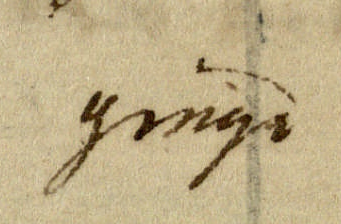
ginge
